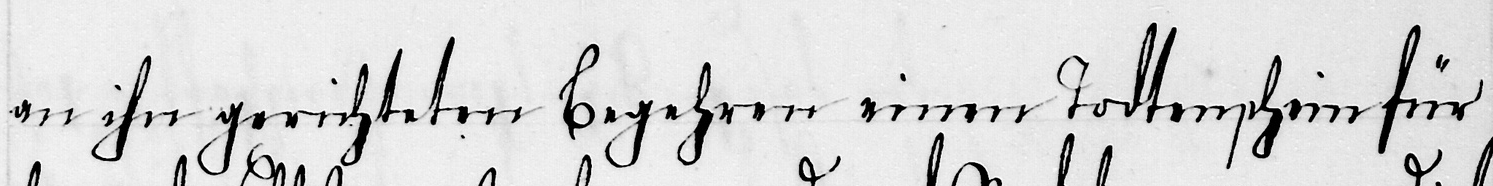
an ihn gerichteten Begehren einen Todtenschein für
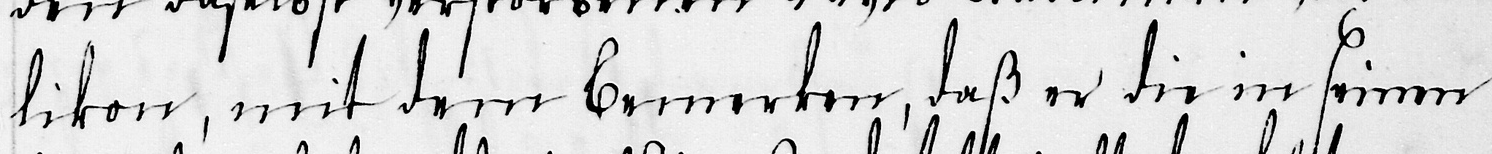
tlikon, mit dem Bemerken, daß er die in seinen
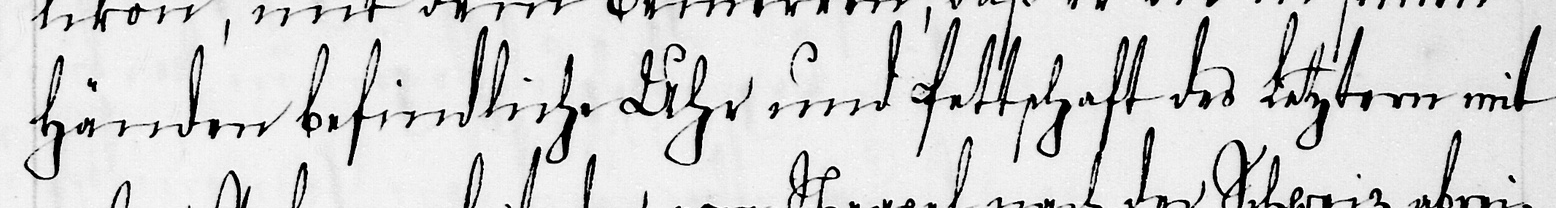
Händen befindliche Uhr und Pettschaft des Letztern mit
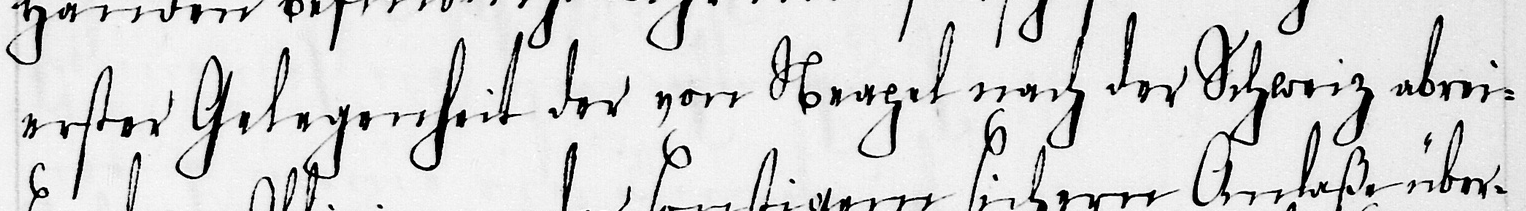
erster Gelegenheit der von Neapel nach der Schweiz abrei¬
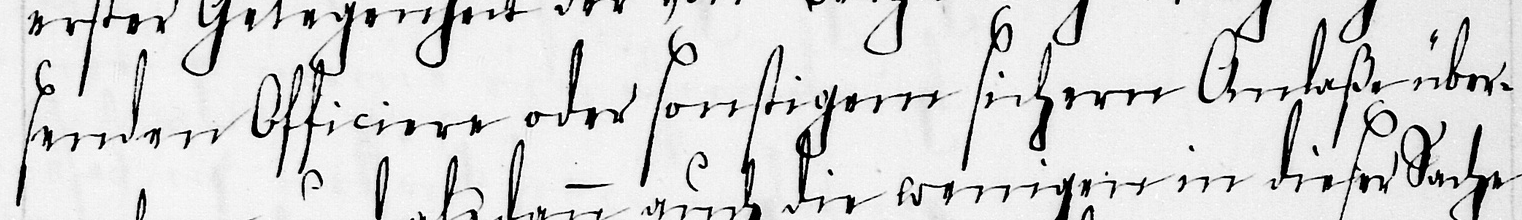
senden Officiere oder sonstigem sichern Anlaße über¬
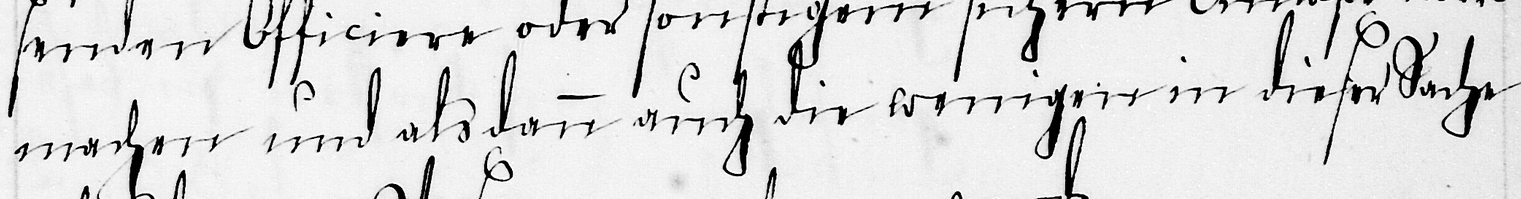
machen und alsdann auch die wenigen in dieser Sache
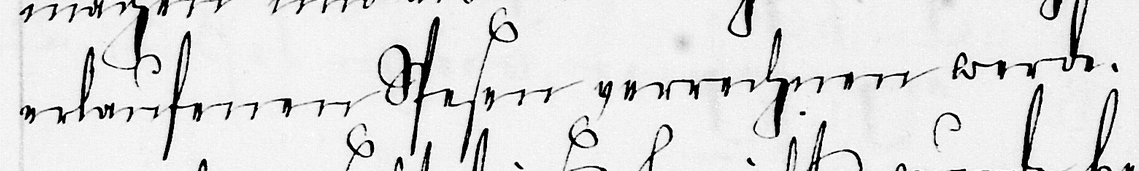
verlaufenen Spesen verrechnen werde.
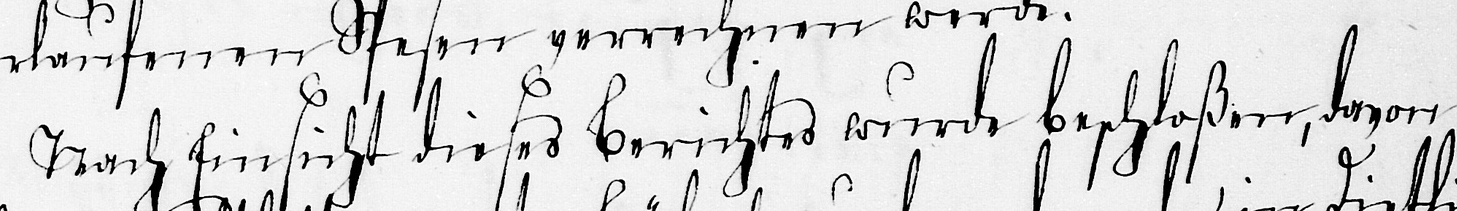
Nach Einsicht dieses Berichtes wurde beschloßen, davon
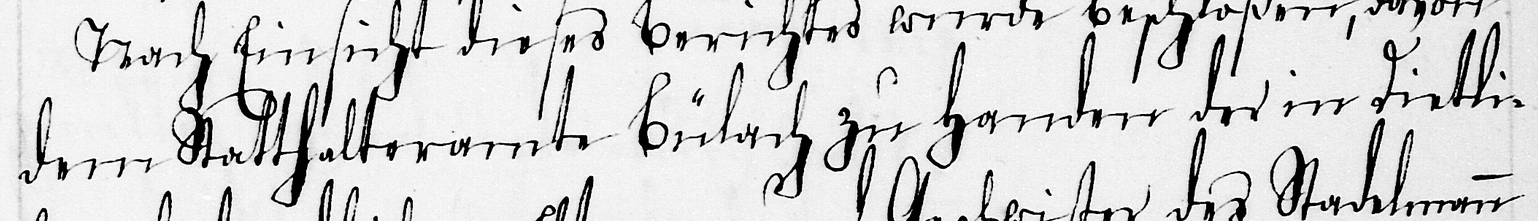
dem Statthalteramte Bülach zu Handen der in Dietli¬
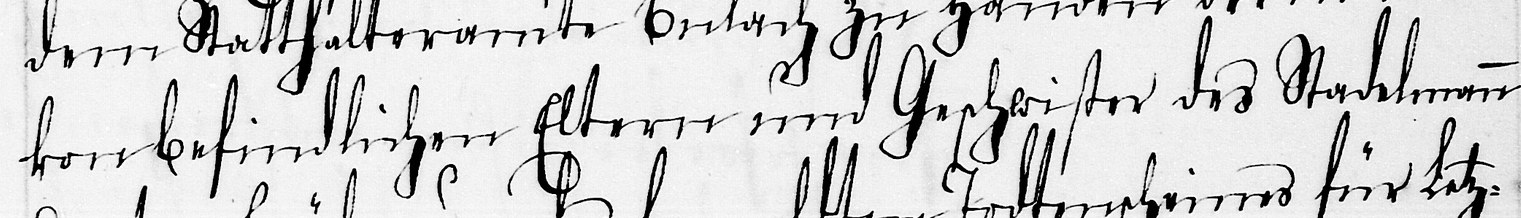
kon befindlichen Eltern und Geschwister des Stadelmann
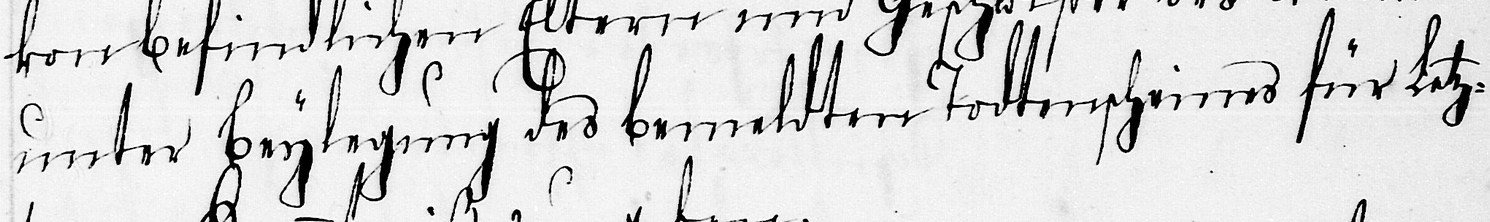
unter Beylegung des bemeldten Todtenscheines für Let¬
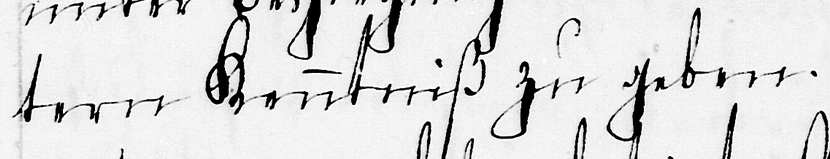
ztern Kenntniß zu geben.
